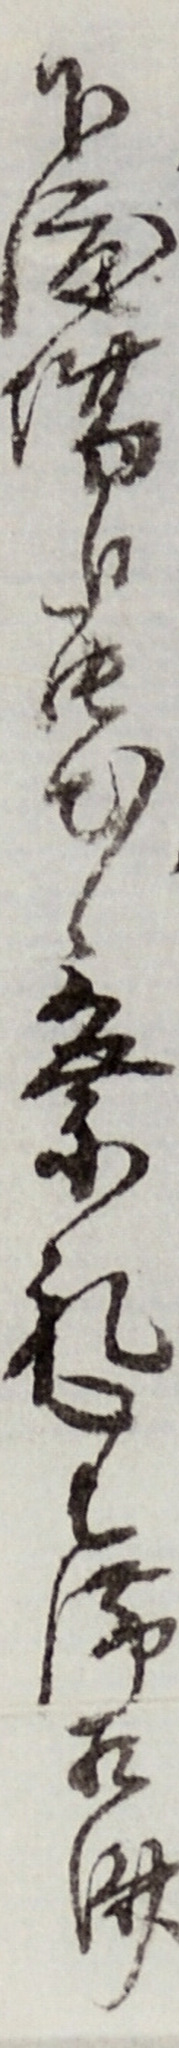下渡場江罷出候祭礼無滞相済
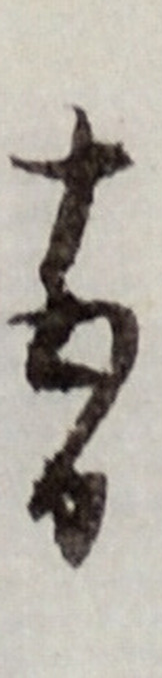十五日
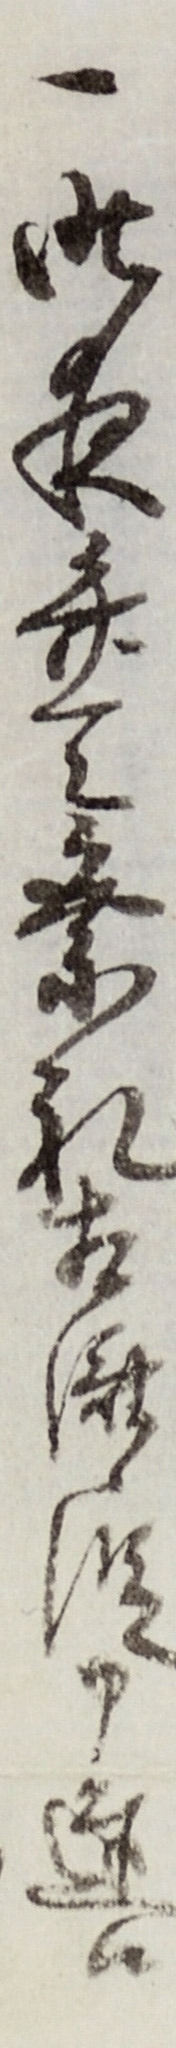一昨夜弁天祭礼相済候段申達候
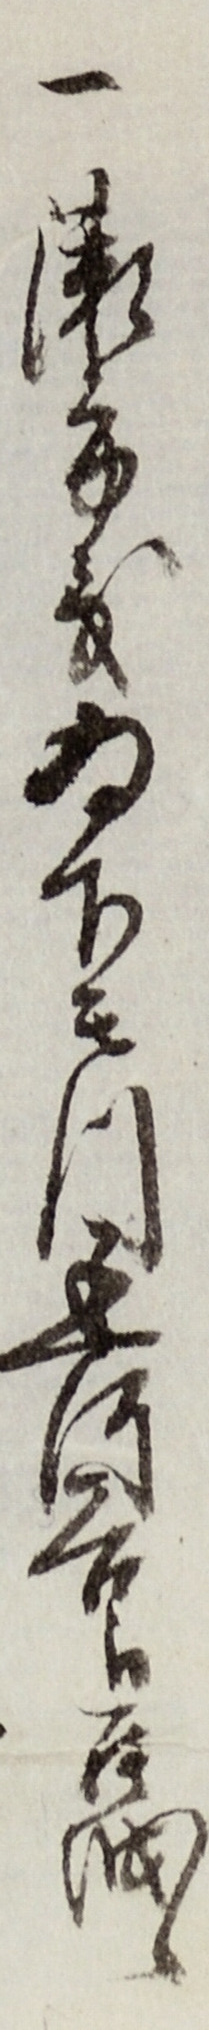一瀬市義為下モ川黒河谷江罷越候
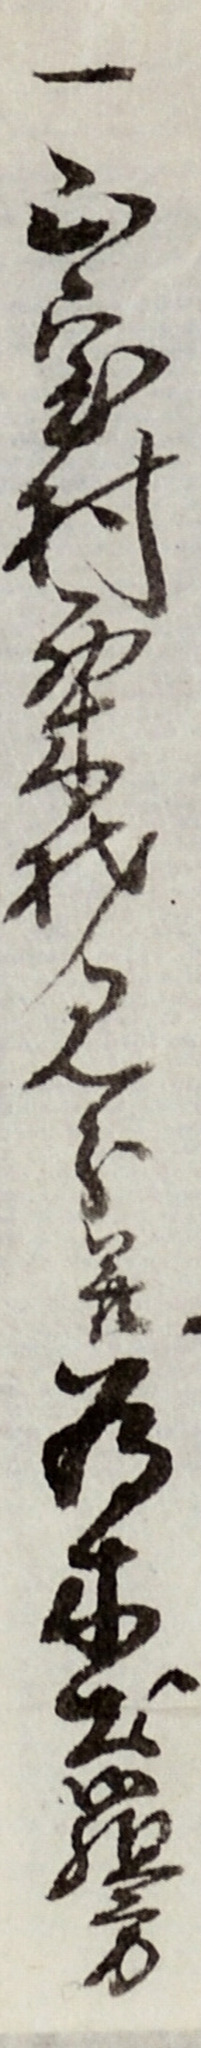一山室村栗材見分并為木出御組方
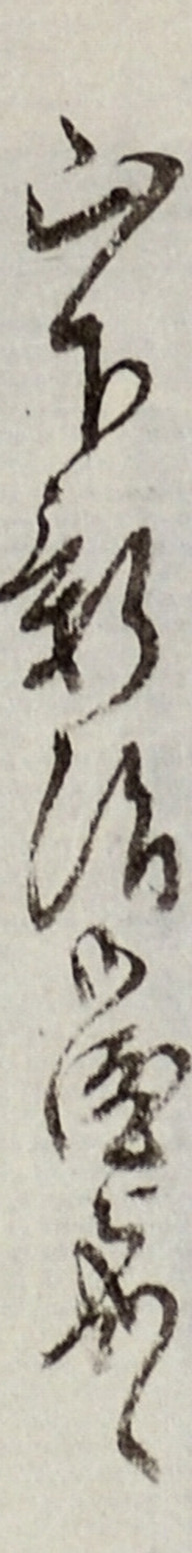山下新治御渡被成候
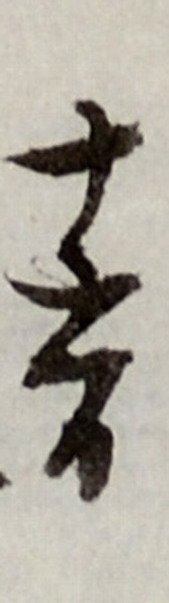十六日
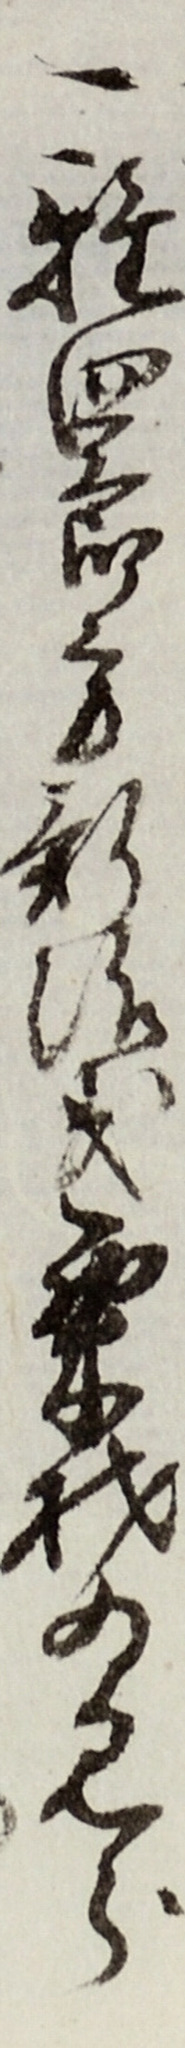一雅四郎方新治義栗材為見分
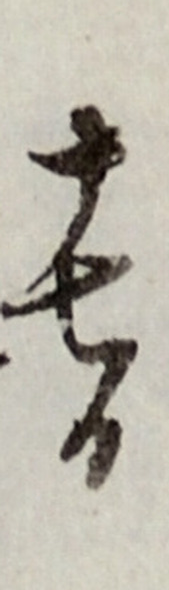十七日
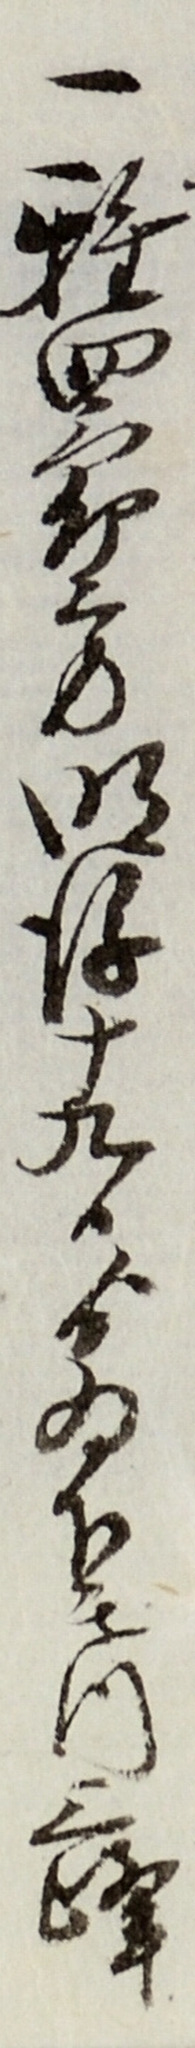一雅四郎方明後十九日ゟ為下モ川三峰
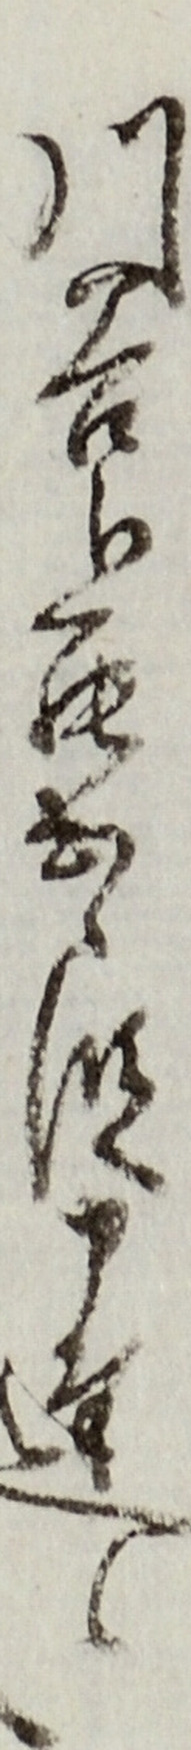川谷江罷出候段申達候
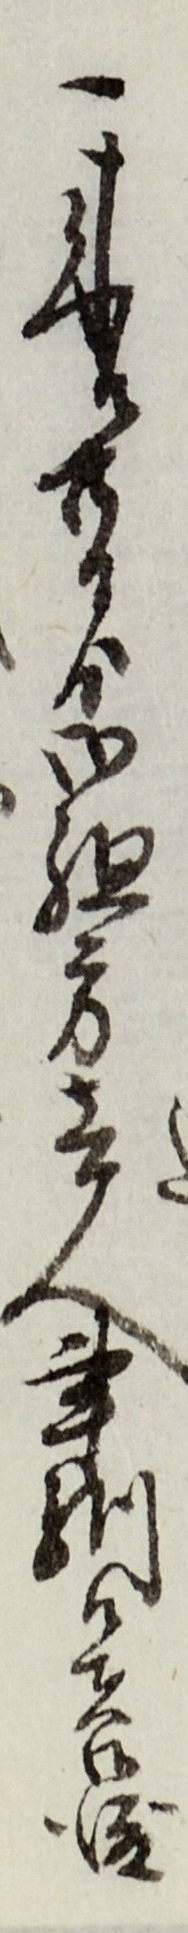一来ル廿日ゟ御組方壱人事馴候者御渡
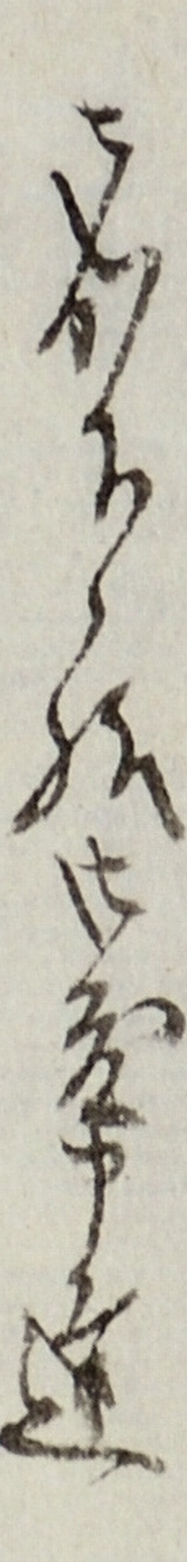被成下候様此度申達
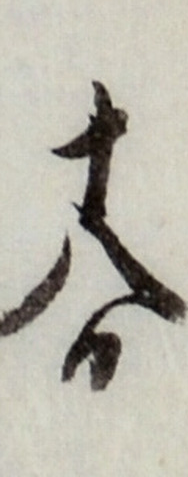十八日
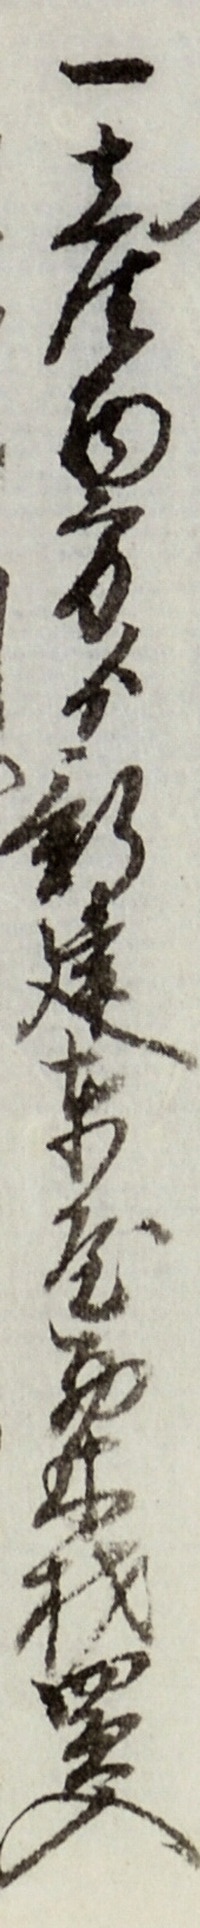一産物方ゟ新建車屋栗材買入
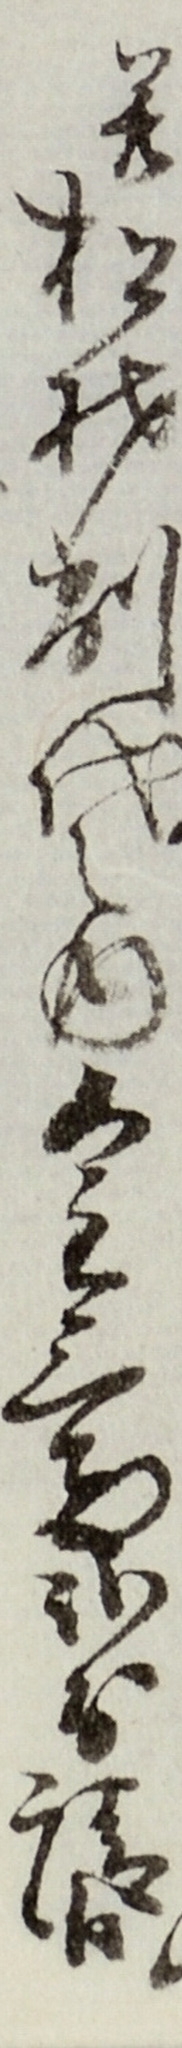并松材削代之内金三両弐分請取
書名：御山方御薪方諸事御用留
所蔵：伊那市立高遠町図書館・合同会社AMANE
